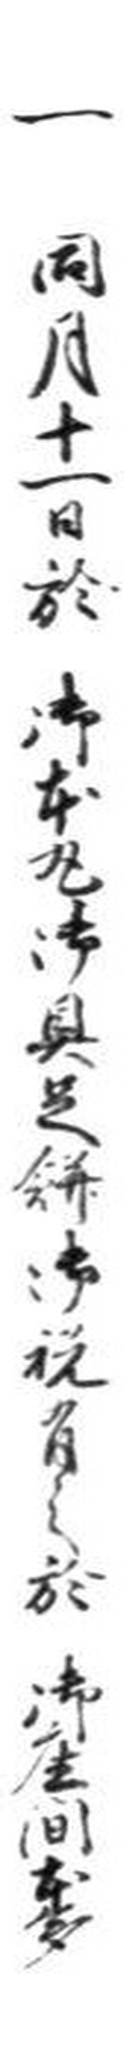一同月十一日於御本丸御具足餅御祝有之於御座間本多
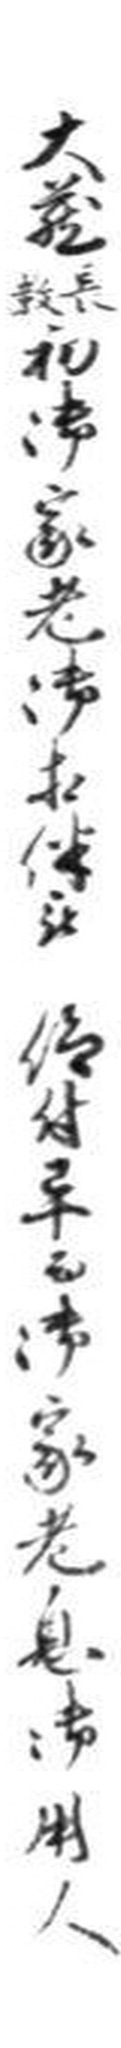教初御家老御相伴被仰付畢而御家老息御用人
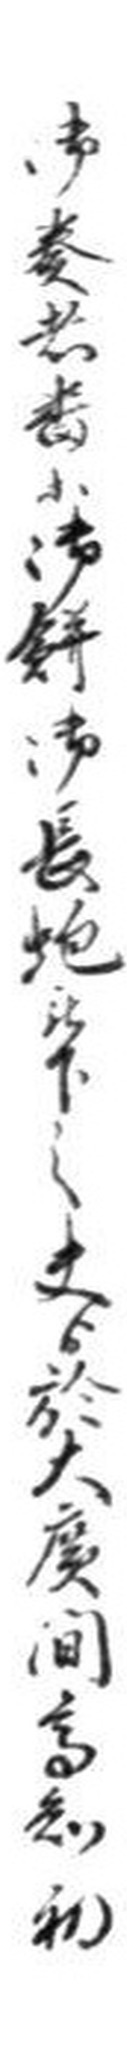御奏者番等御餅御長蚫被下之夫ゟ於大広間高知初
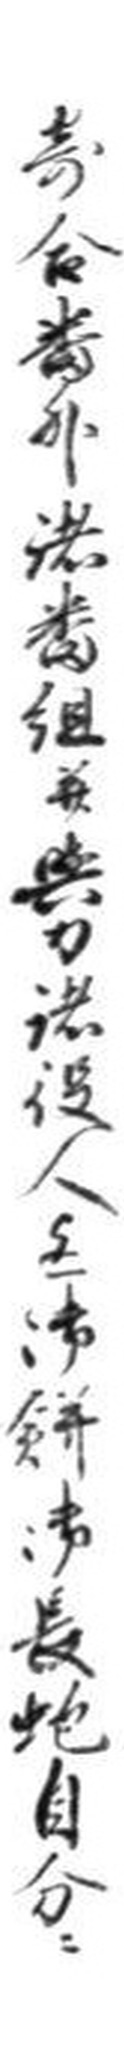寄合番外諸番組并与力諸役人迄御餅御長蚫自分ニ
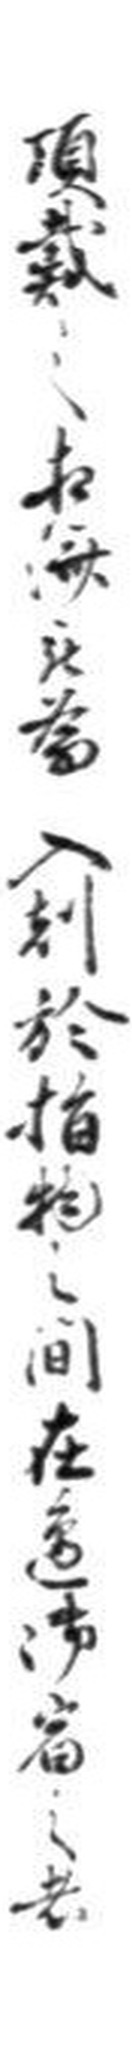頂戴之相済被為入刻於指物之間在辺御宿之者
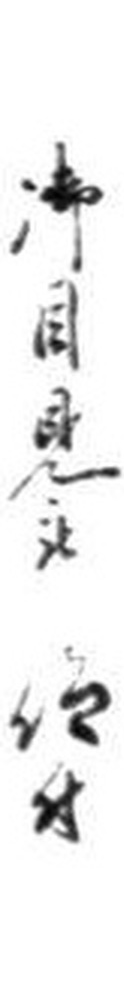御目見被仰付
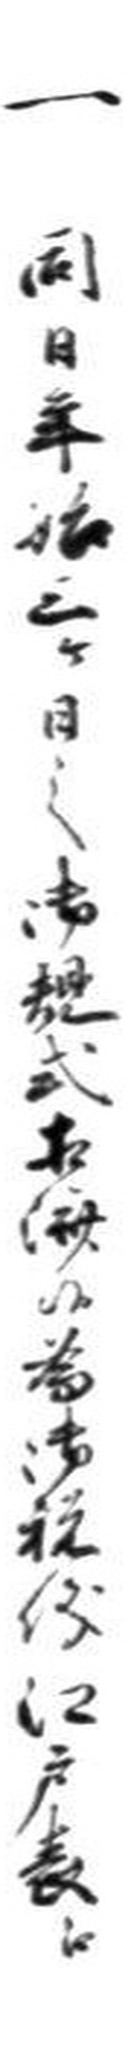一同日年始三ケ日之御規式相済候為御祝儀江戸表江
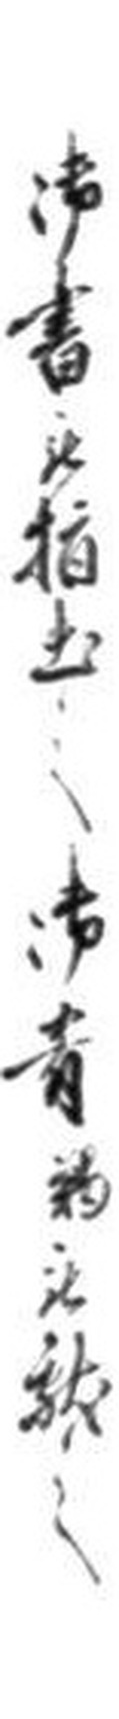御書被指出之御肴被献之
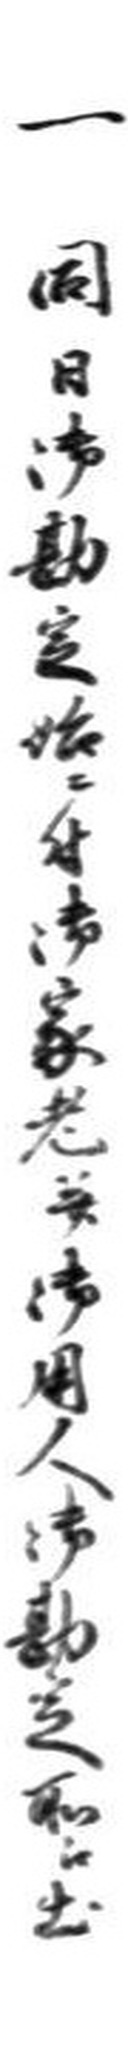一同日勘定始ニ付御家老并御用人御勘定所江出
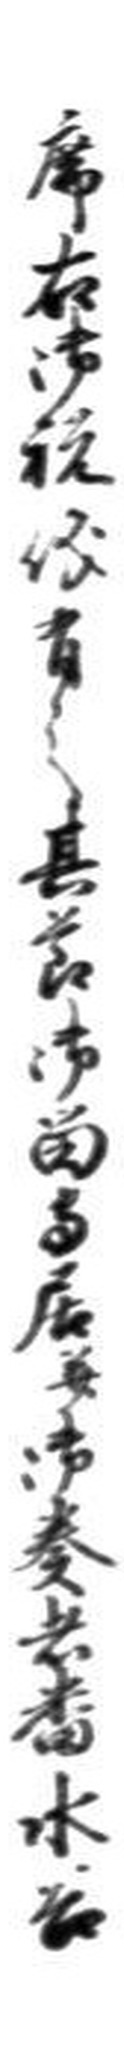席右御祝儀有之其節御留守居并御奏者番水谷
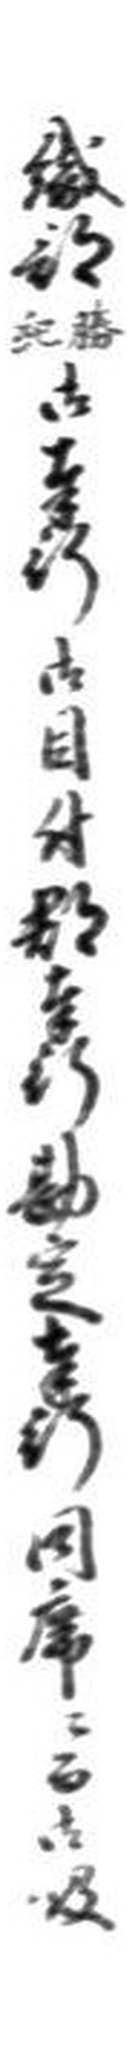紀御奉行御目付郡奉行勘定奉行同席ニ而御吸
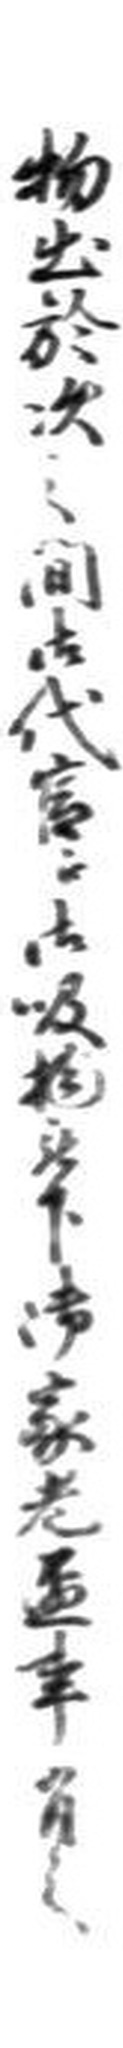物出於次之間御代官江御吸物被下御家老盃事有之
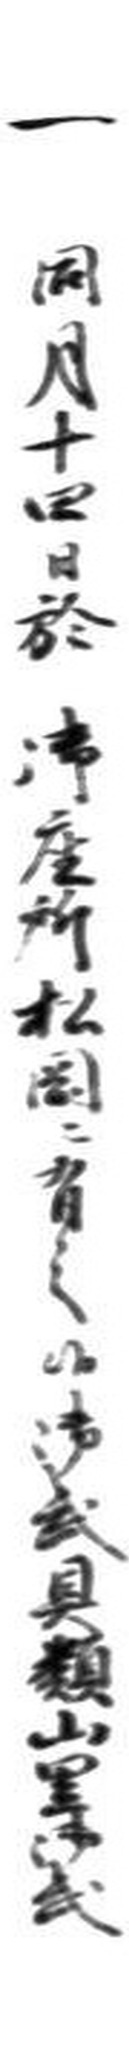一同月十四日於御座所松岡ニ有之候御武具類山里御武
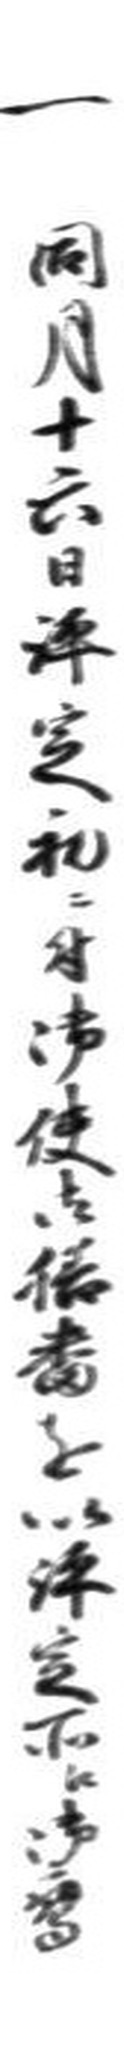一同月十六日評定初ニ付御使御膳番を以評定所江御鷹
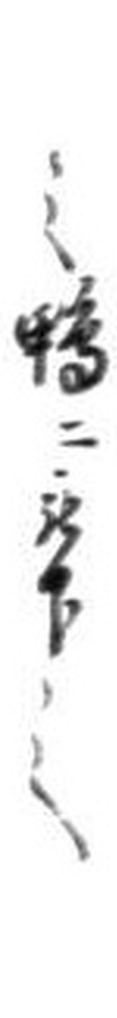之鴨二被下之
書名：家譜 三十六 宗昌公 従享保八年到同九年
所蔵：福井県文書館 Fukui Prefectural Archives
